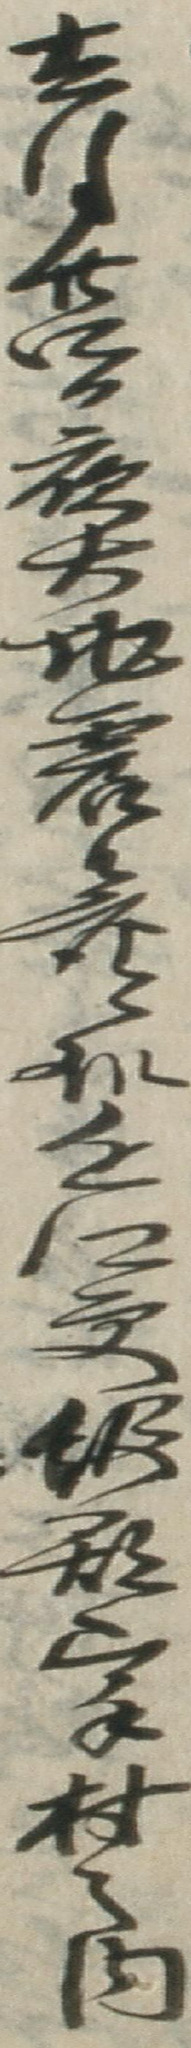去月廿四日夜大地震御座候処近郷更級郡山手村之内
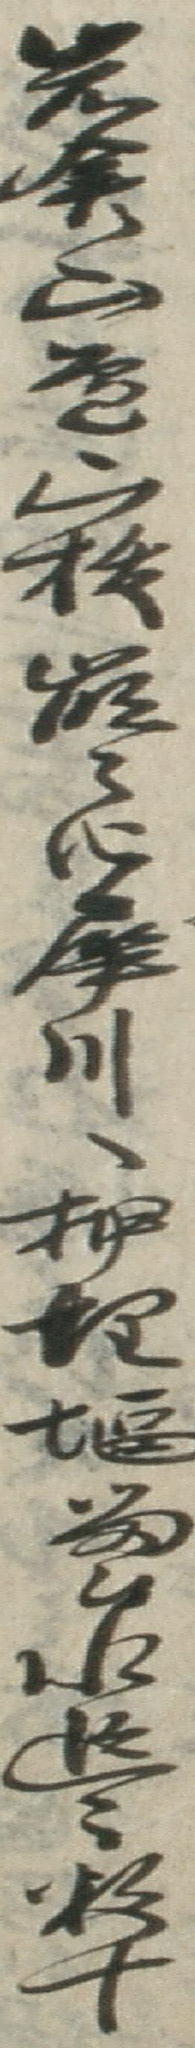岩倉山辺山抜崩候由犀川へ押埋堰留候水追々数十
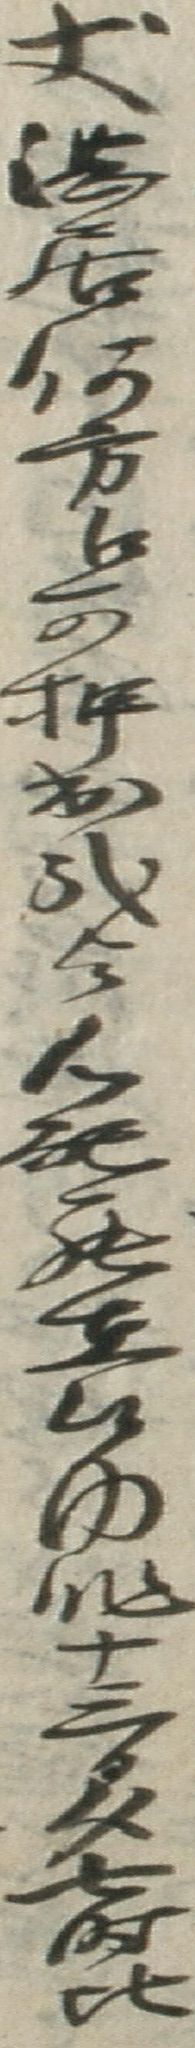丈湛居何方江可押出哉と心配罷在候内昨十三日夕七時比
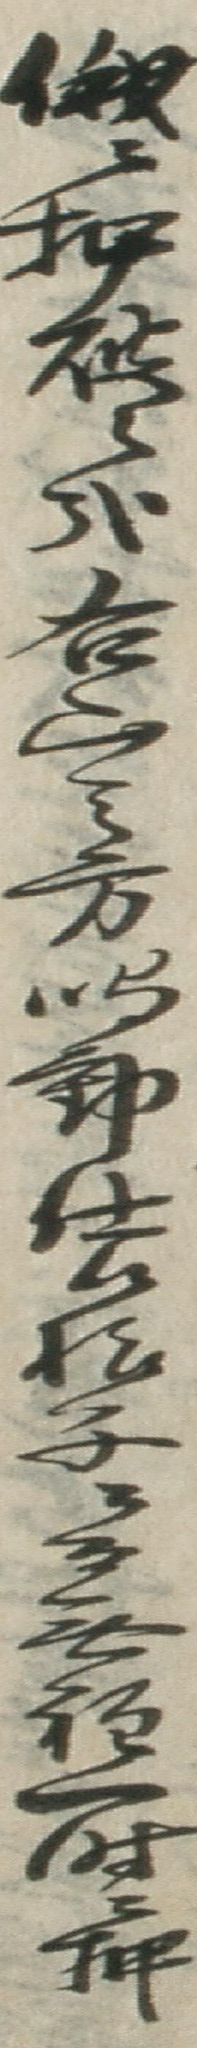俄二押破候哉右山之方鳴動仕候様子二而無程一時二押
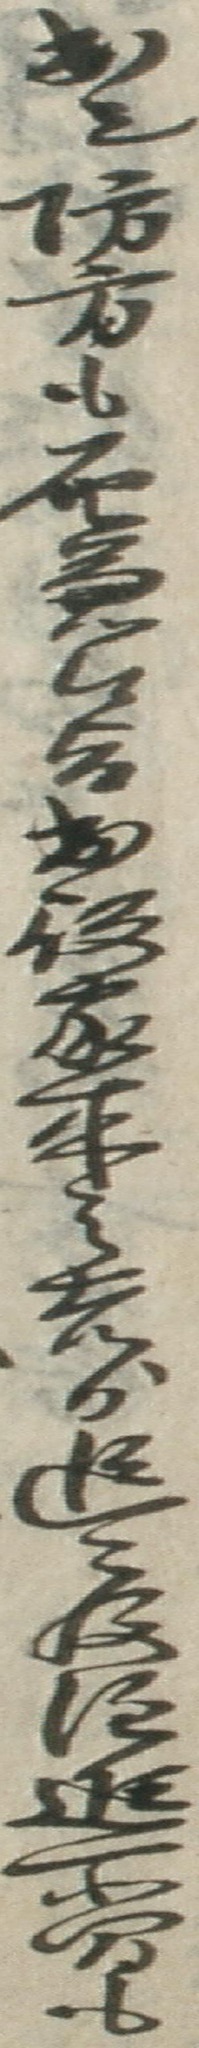出シ防方も届兼候旨出役家来之者共ゟ追々及注進所間も
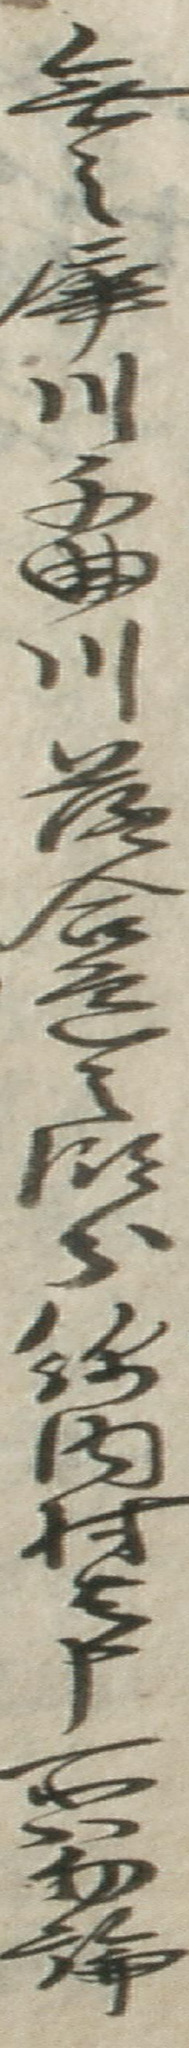無之犀川千曲川落合辺之領分綿内村と申所ハ勿論
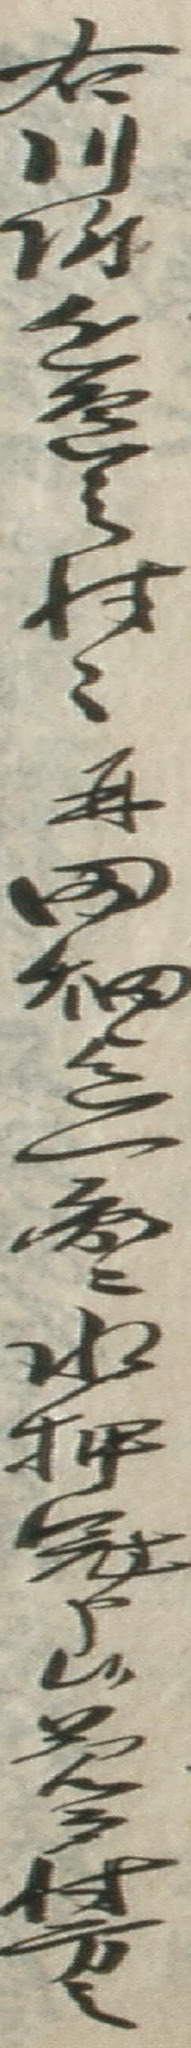右川附近辺之村々并田畑迄一円に水押冠申候兼而村方之
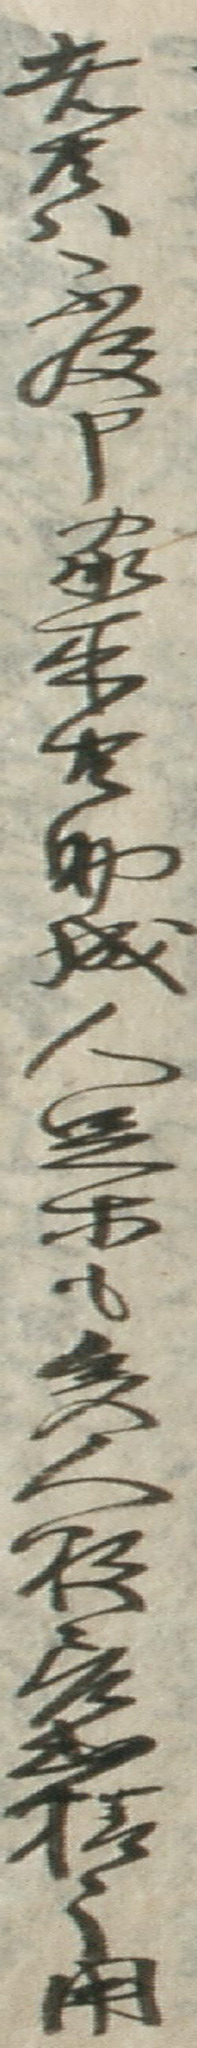者共ハ不及申家来共助成人足等も多人数差出精々用
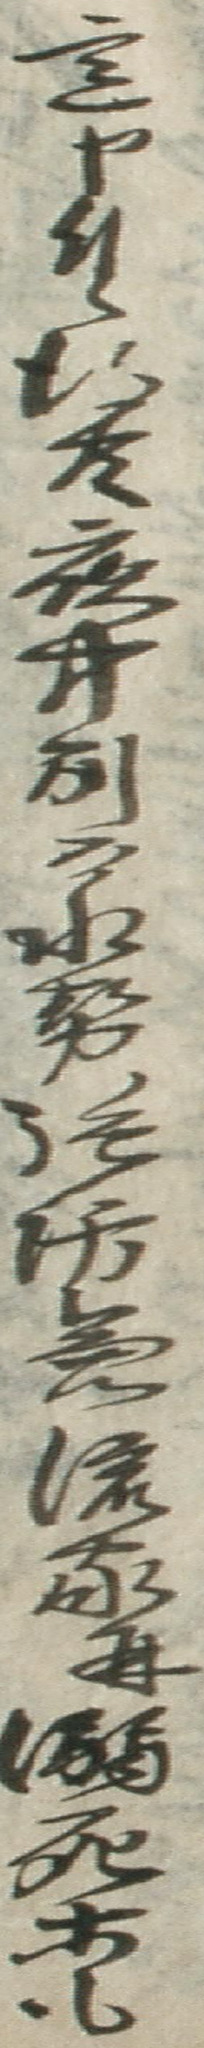意申付候得共夜中別而水勢強防兼流家并溺死等も
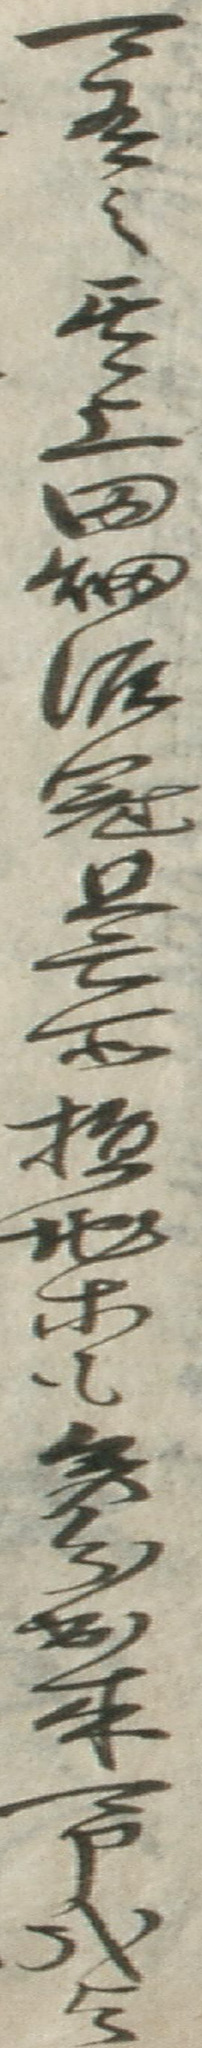可有之其上田畑泥冠且亡所損地等も多分出来可申哉と
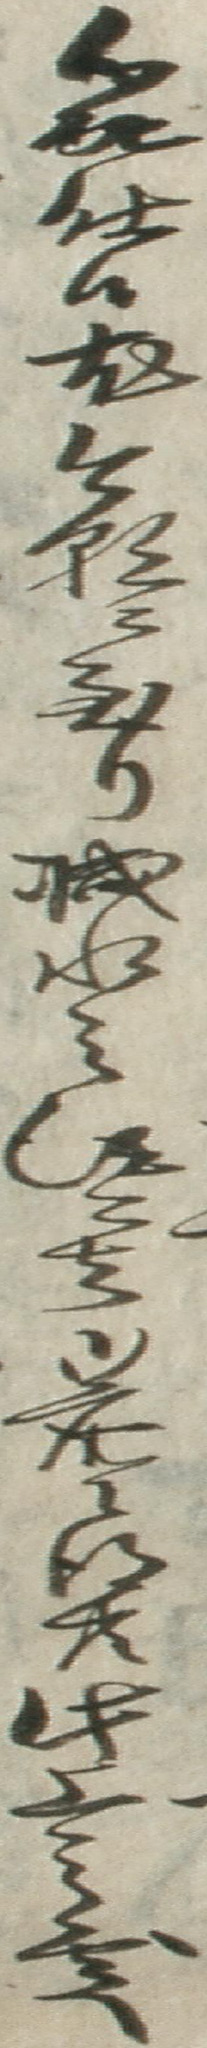心配仕候尤今朝二至減水之趣二ハ御座候得共此上之処
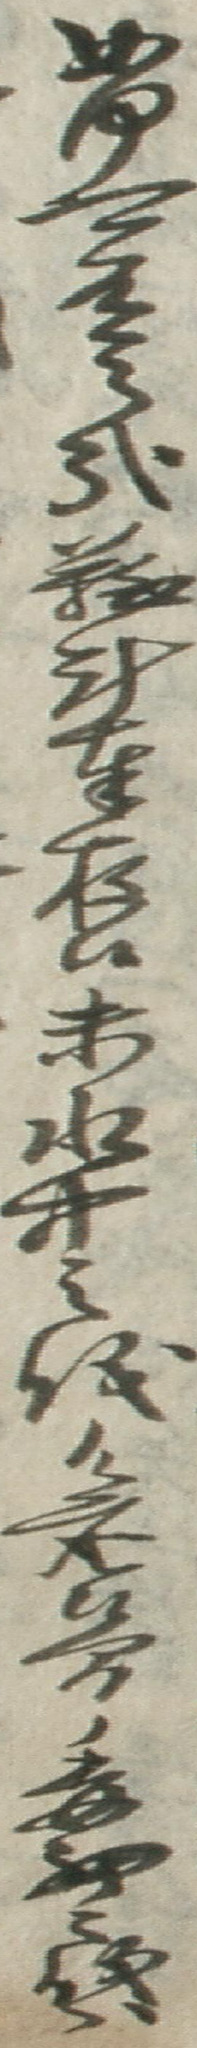如何可有之哉難計奉存候未水中之儀御座候間委細之儀ハ
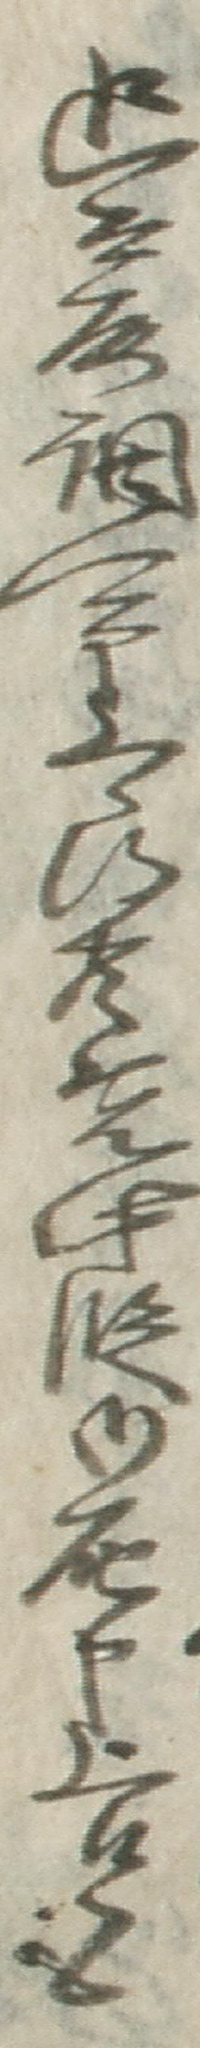追而取調可申上候得共先此段御届申上候以上
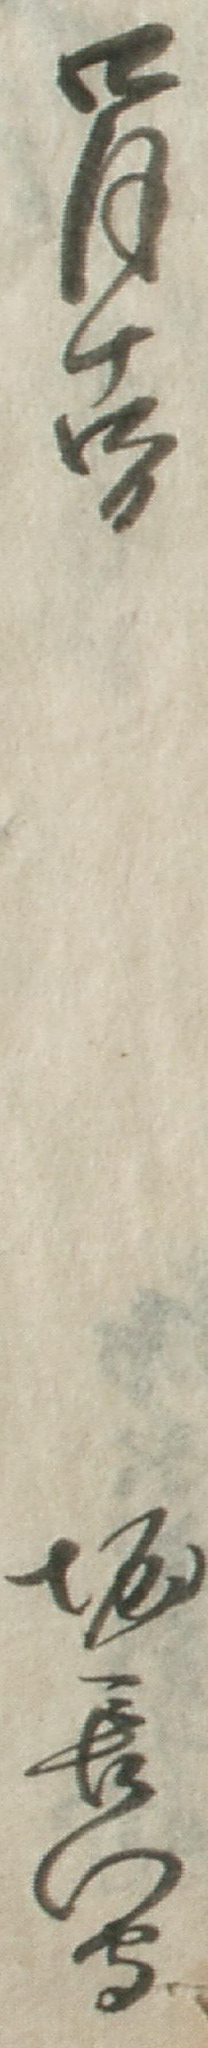四月十四日堀長門守

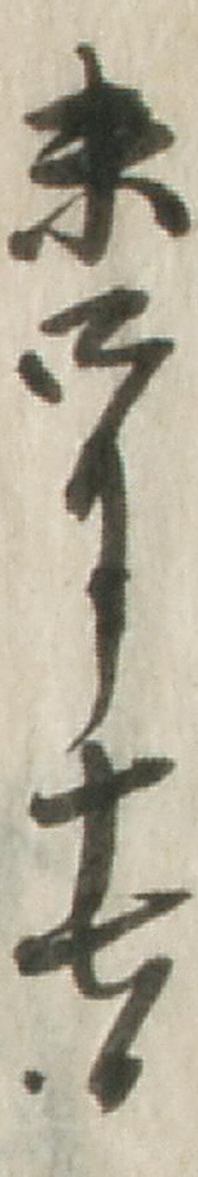未四月十七日
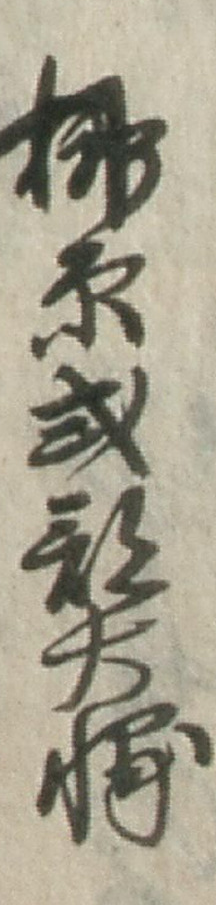榊原式部大輔
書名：信濃國地震實録記
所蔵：東京大学地震研究所図書室 Earthquake Research Institute Library, The University of Tokyo, JAPAN
